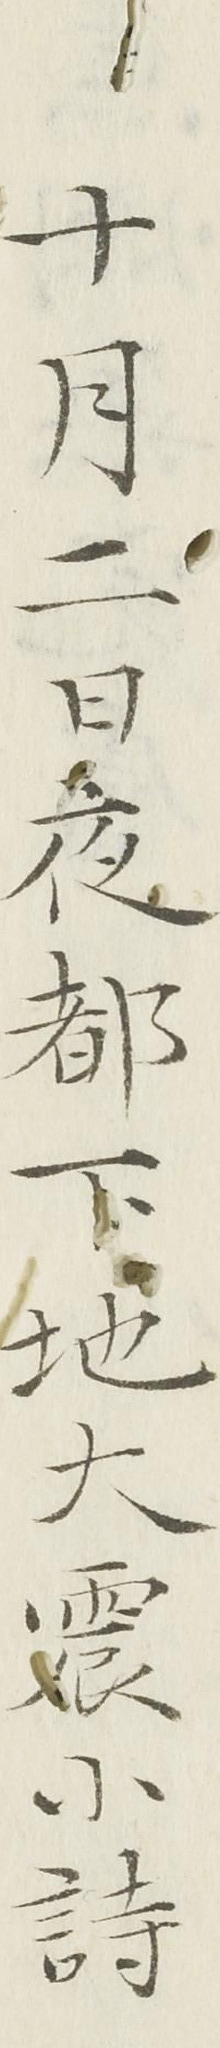十月二日夜都下地大震小詩
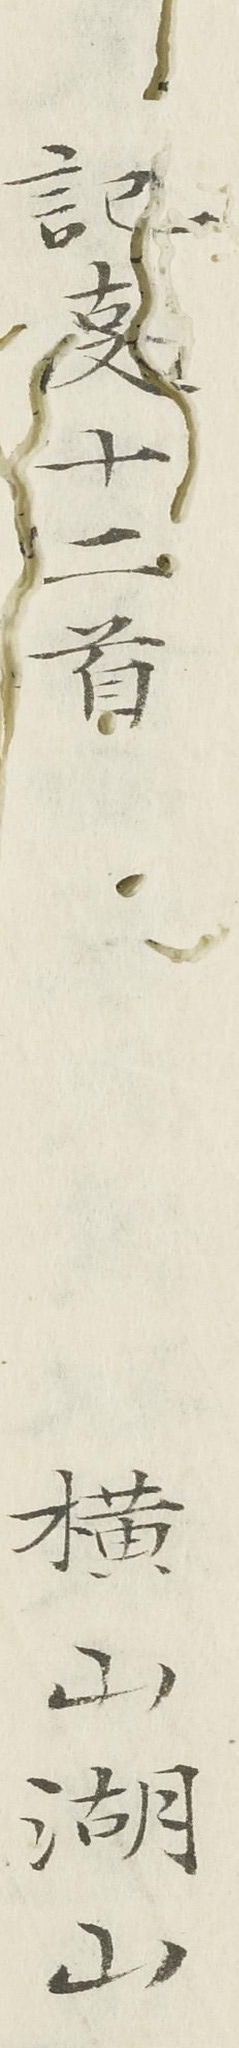記事十二首横山湖山
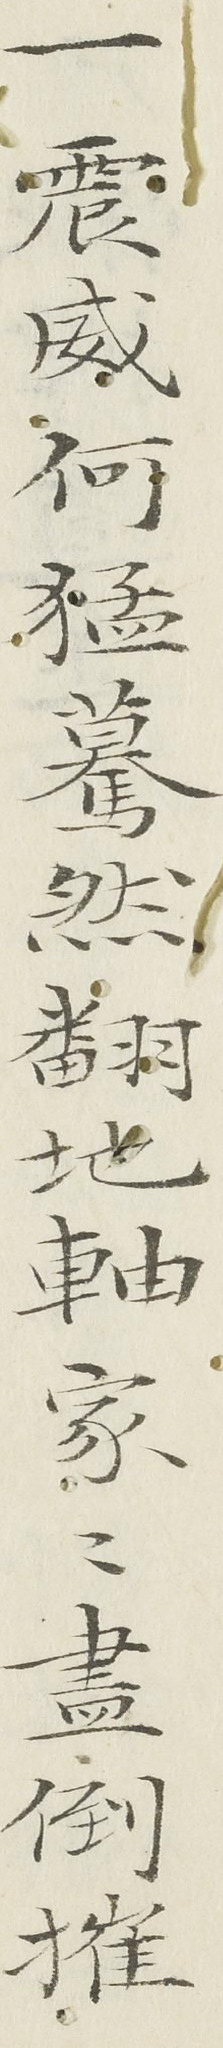一震威何猛驀然翻地軸家々尽倒摧
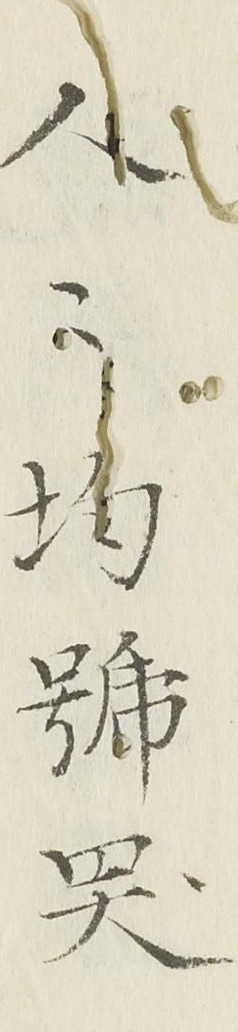人々拘号哭
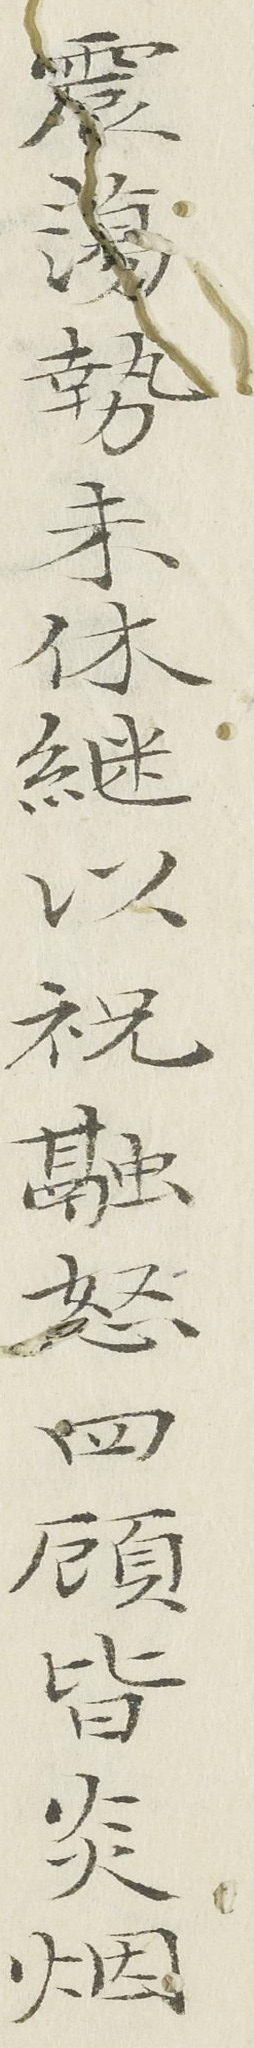震蕩勢未休継以祝融怒四願皆炎烟
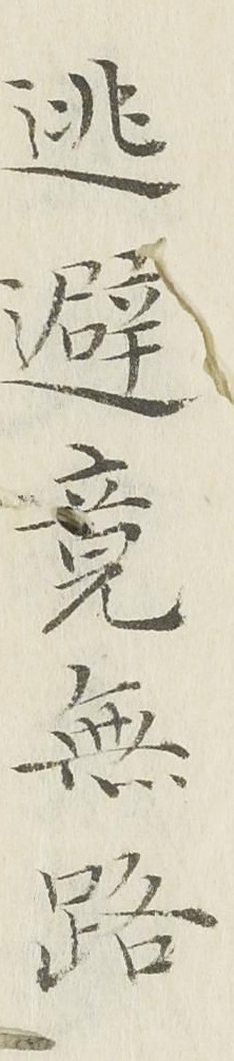逃避竟無路

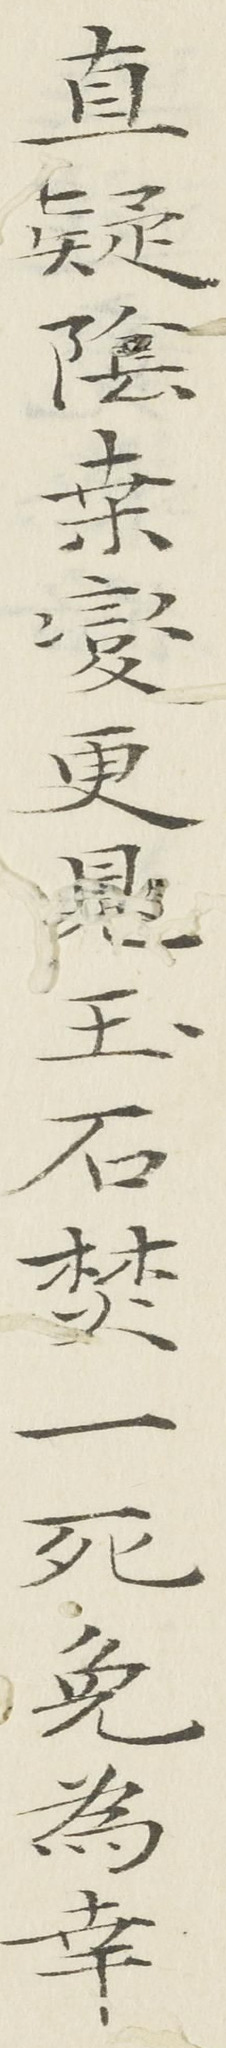直疑陰桒変更見玉石焚一死免為幸
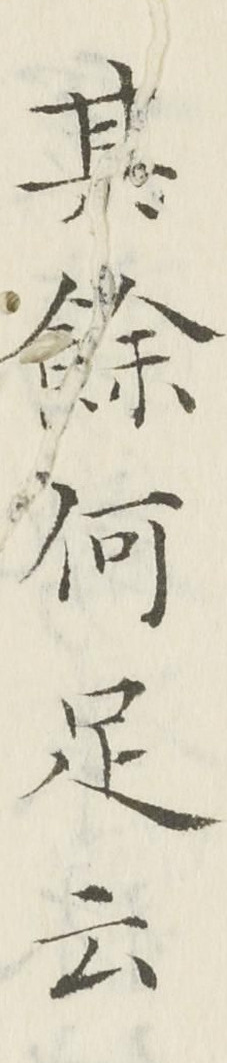其餘何足云
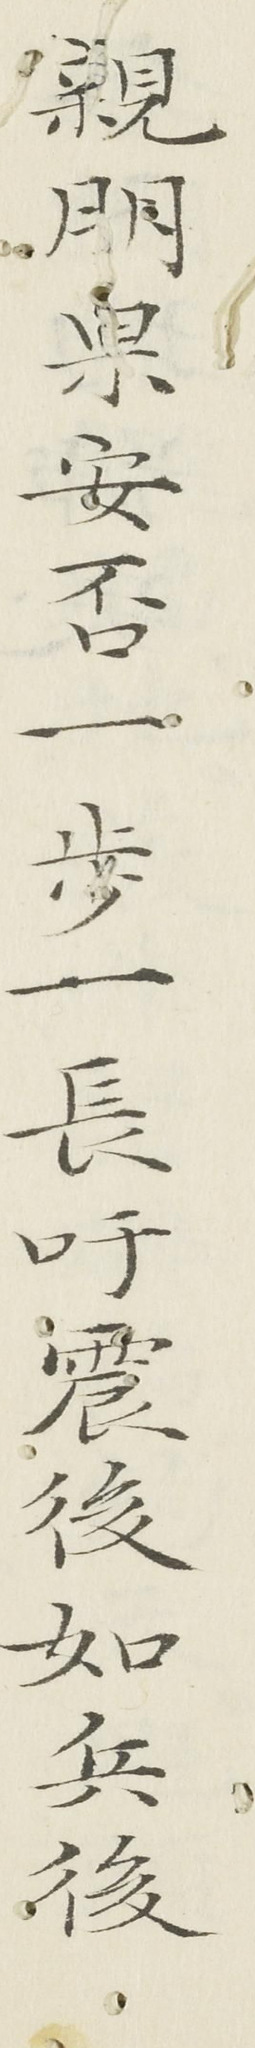親朋県安否一歩一長呼震後如兵後
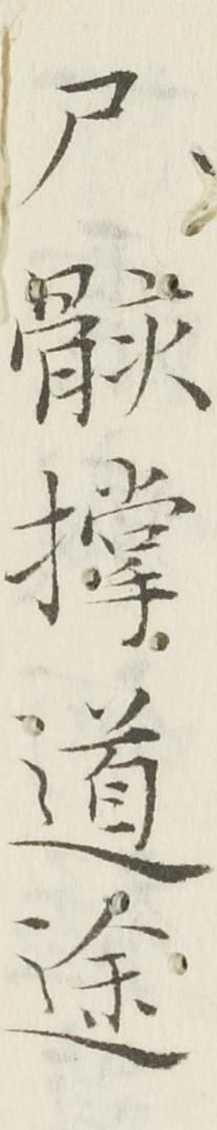尸骸撑道途
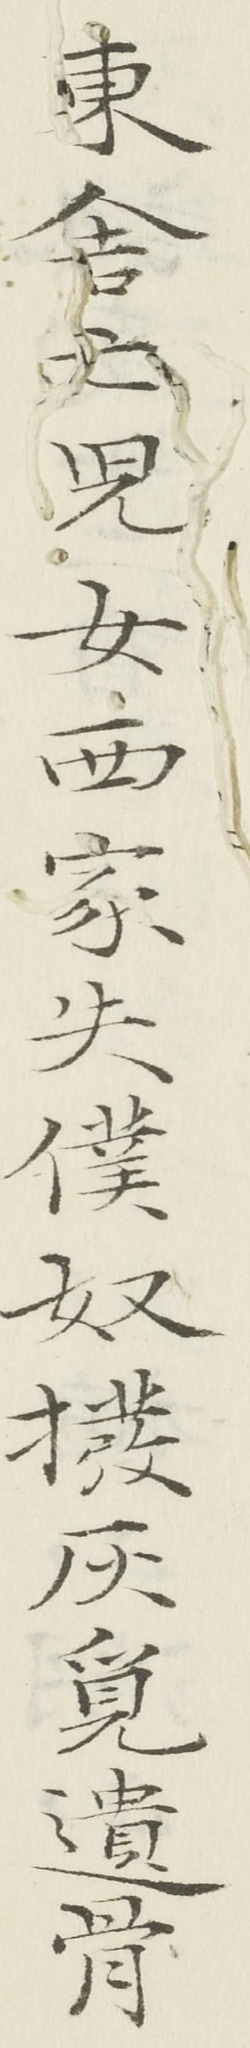東舎亡児女西家失僕奴撥灰覓遺骨
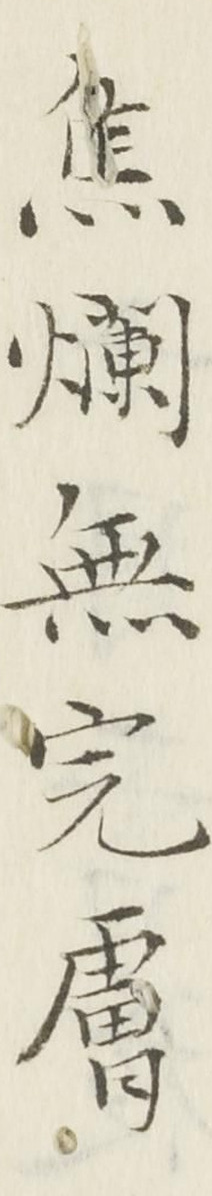焦爛無完膚
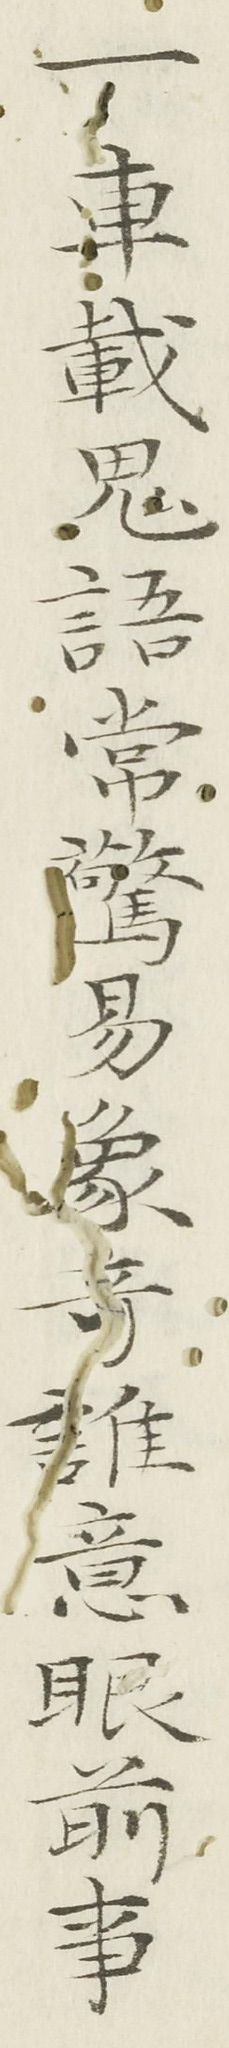一車載鬼語常驚易象奇誰意眼前事
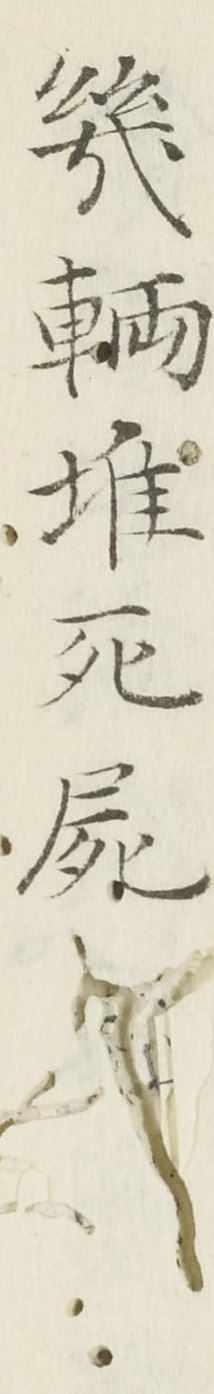幾輌堆死屍
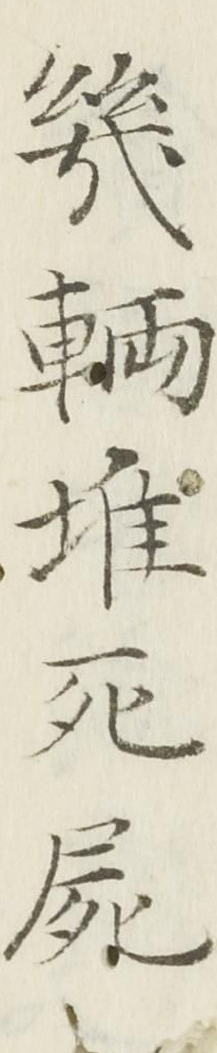幾輌堆死屍
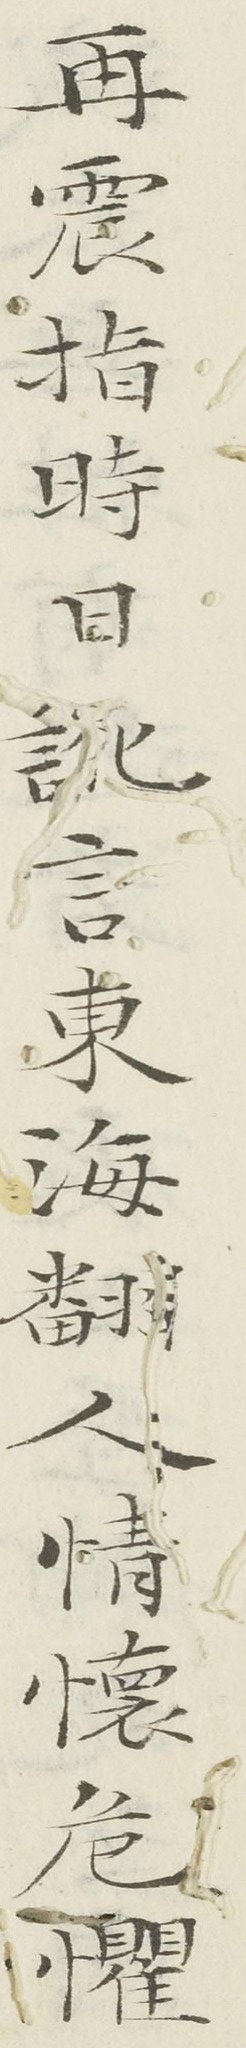再震指時日訛言東海翻人情懐危懼
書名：地震考證　全
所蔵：東京大学地震研究所図書室 Earthquake Research Institute Library, The University of Tokyo, JAPAN
